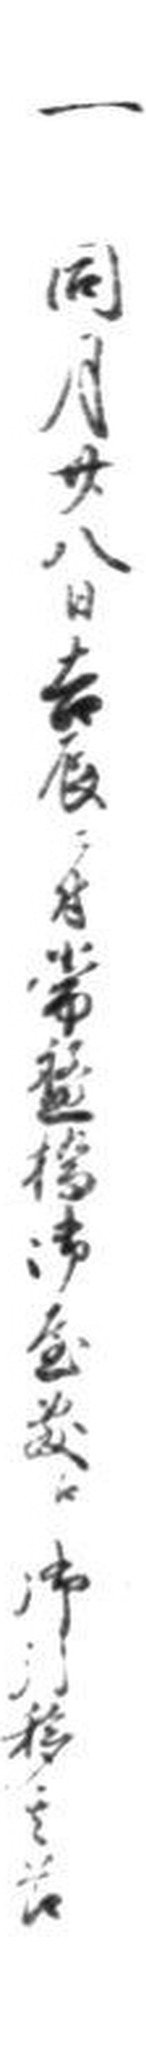一同月廿八日吉辰ニ付常盤橋御屋敷江御引移其節
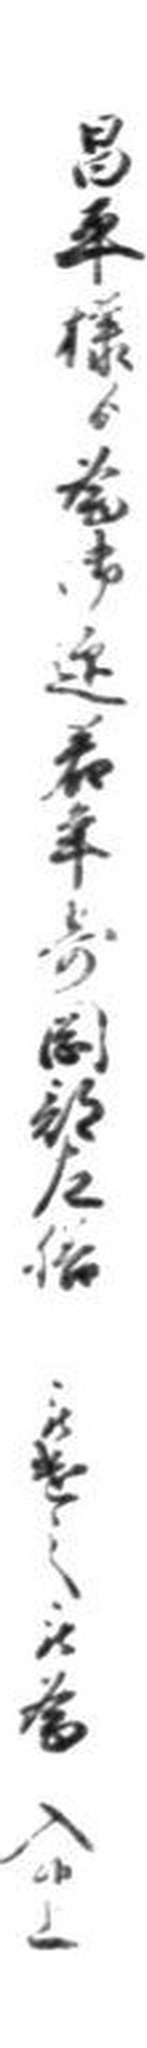昌平様ゟ為御迎若年寄岡部左膳被遣之被為入候上
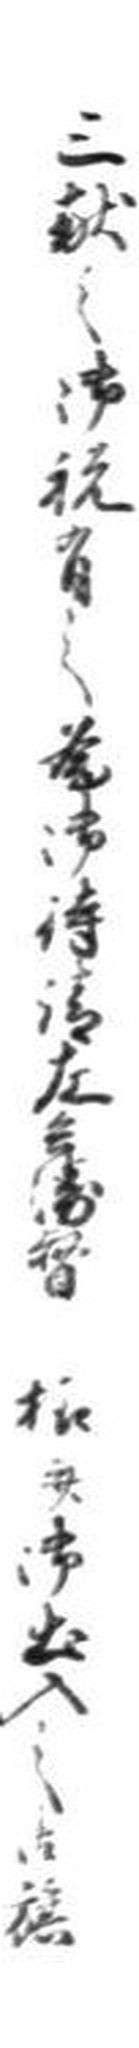三献之御祝有之為御待請左兵衛督様幷御出入之御旗
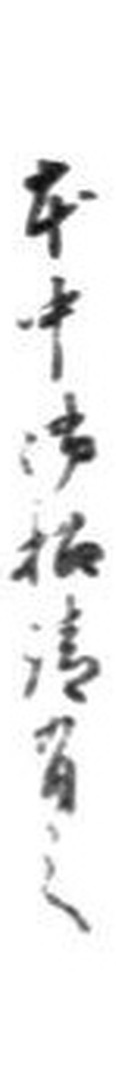本中御指請有之

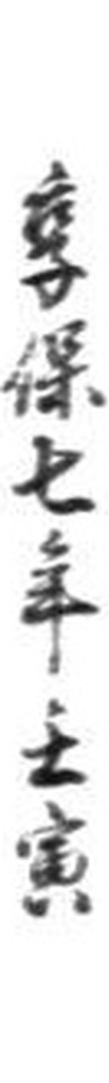享保七年壬寅
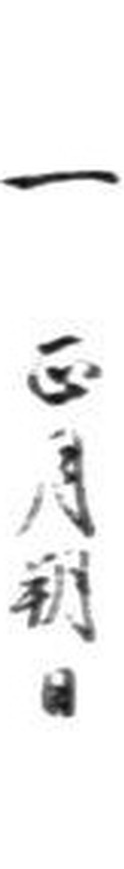一正月朔日
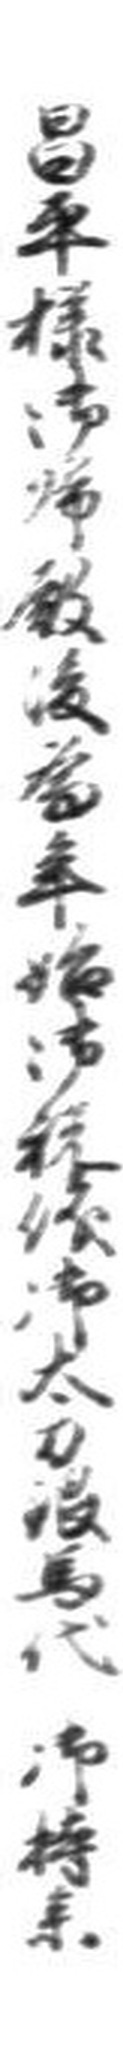昌平様御帰殿後為年始御祝儀小太刀銀馬代御持参
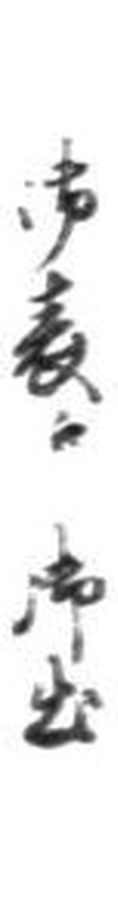御表江御出
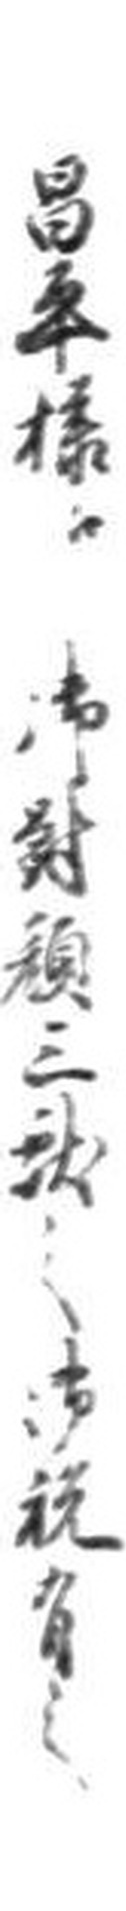昌平様江御対顔三献之御祝有之
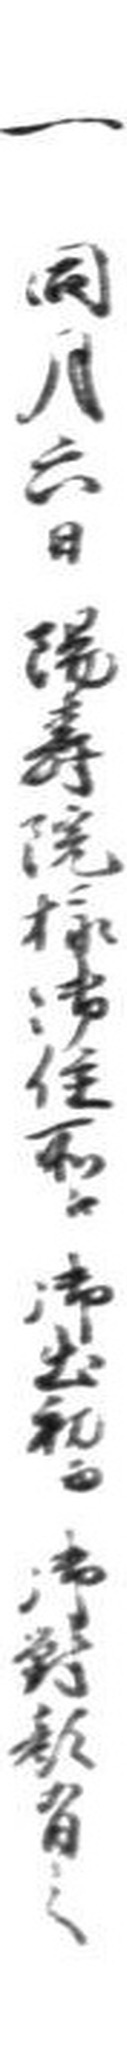一同月六日陽寿院様御住所江御出初而御対顔有之
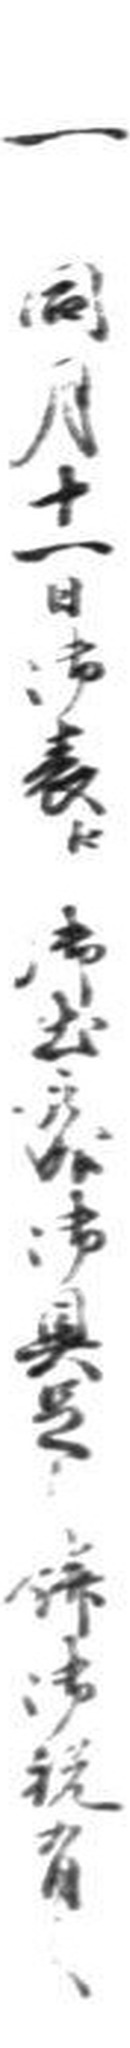一同月十一日御表江御出被成御具足之餅御祝有之

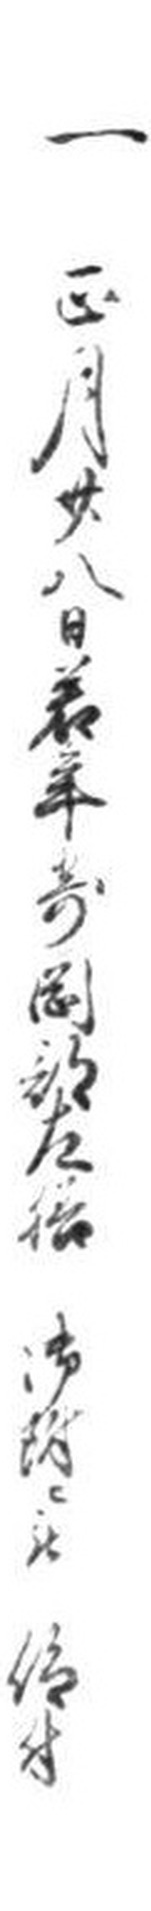一正月廿八日若年寄岡部左膳御附ニ被仰付
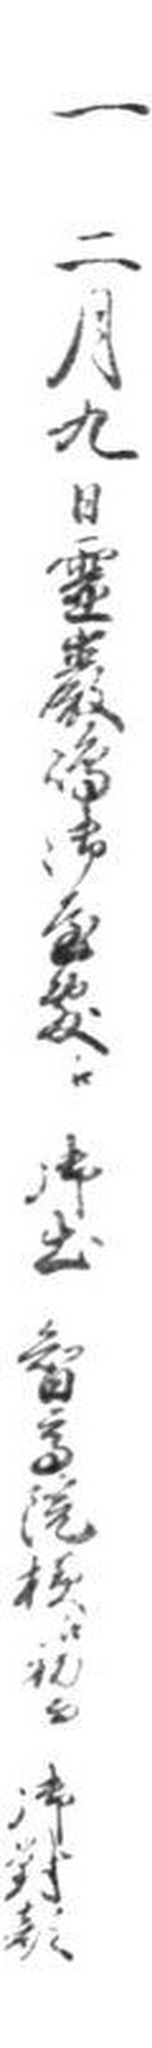一二月九日霊巖嶋御屋敷江御出智高院様江初而御対顔
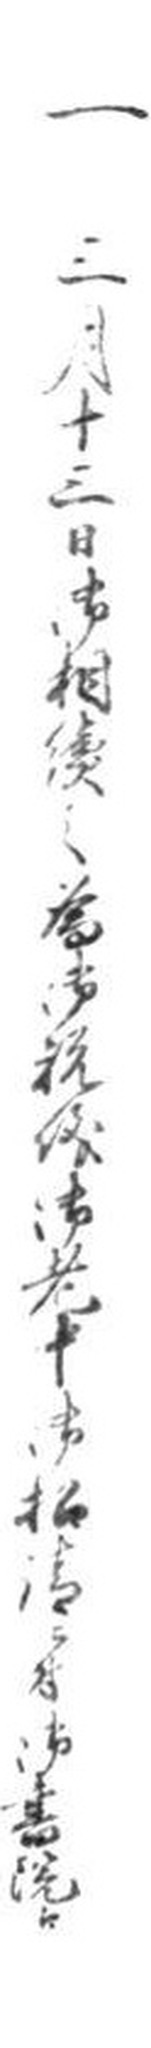一三月十三日御相続之為御祝儀御老中御招請ニ付御書院江
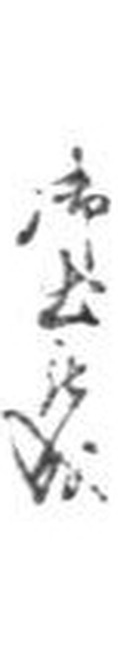御出被成
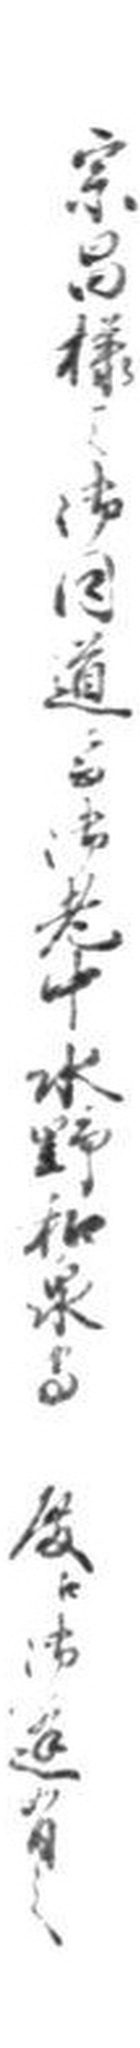宗昌様之御同道ニ而御老中水野和泉守殿江御逢有之
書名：家譜 三十七 宗矩公 従正徳五年到享保九年五月
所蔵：福井県文書館 Fukui Prefectural Archives
